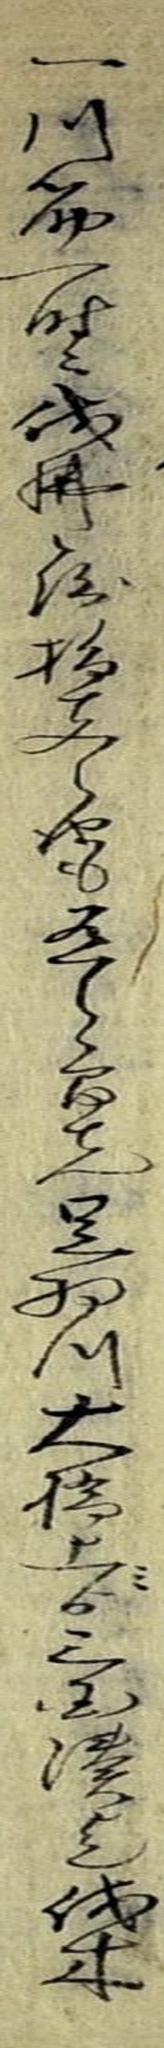一川筋一時に伐払候儀指支之儀も有之候間先足羽川大橋上みゟ三国湊迄伐木
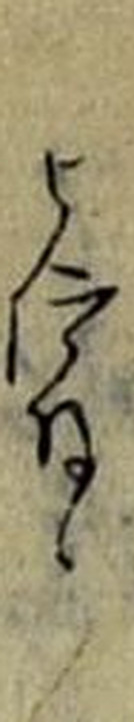被仰付候
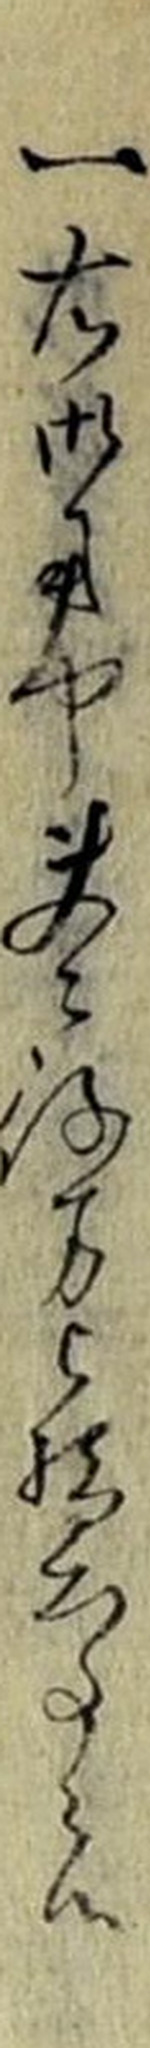一右御用中夫々役方被指出事に候
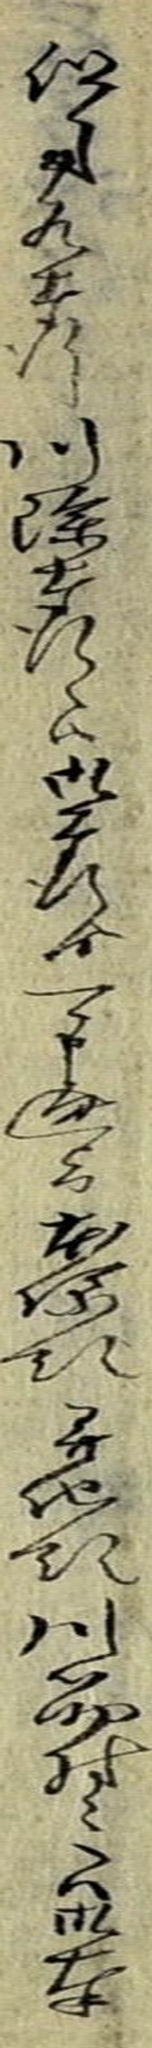但用水奉行川除奉行へは御奉行ゟ可申通旨本保領并他領川筋村々へは御奉
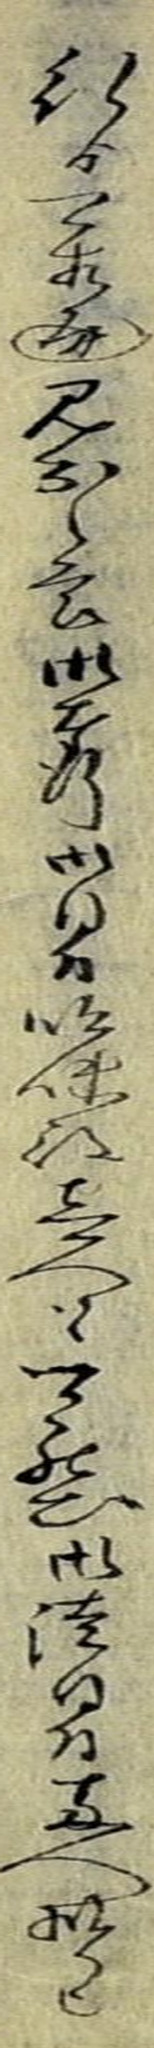行ゟ可相通見分之節御奉行御目付吟味役壱人つヽ可罷出御徒目付両人掛り被
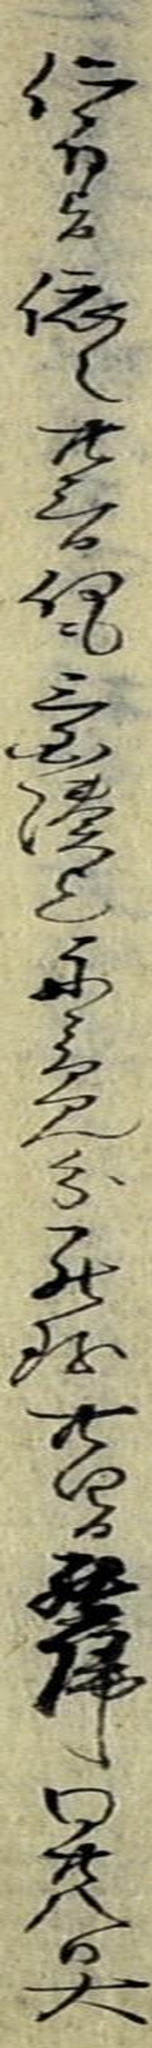仰付旨依之廿三日何も三国湊迄舟に而見分罷越廿四日罷帰同廿八日大
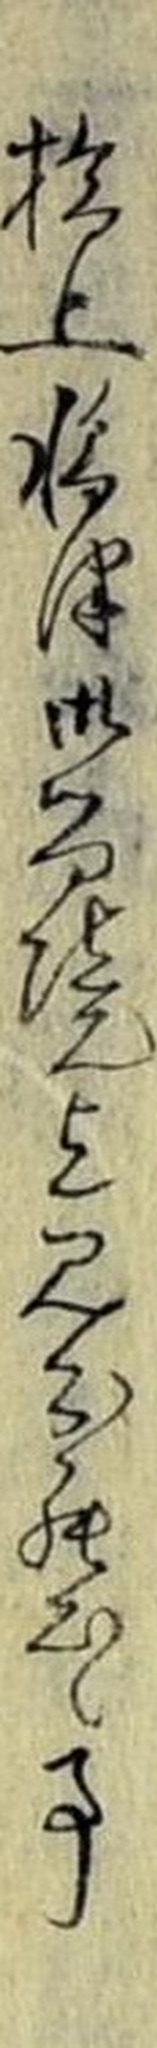橋上稲津御留境迄見分罷出候事
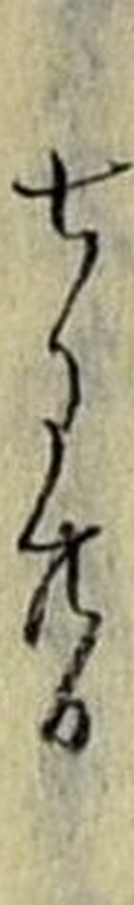七月廿日
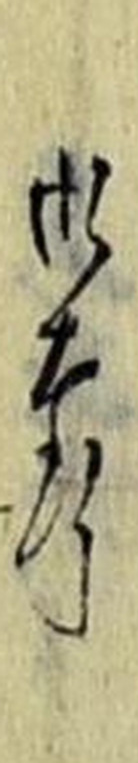御奉行
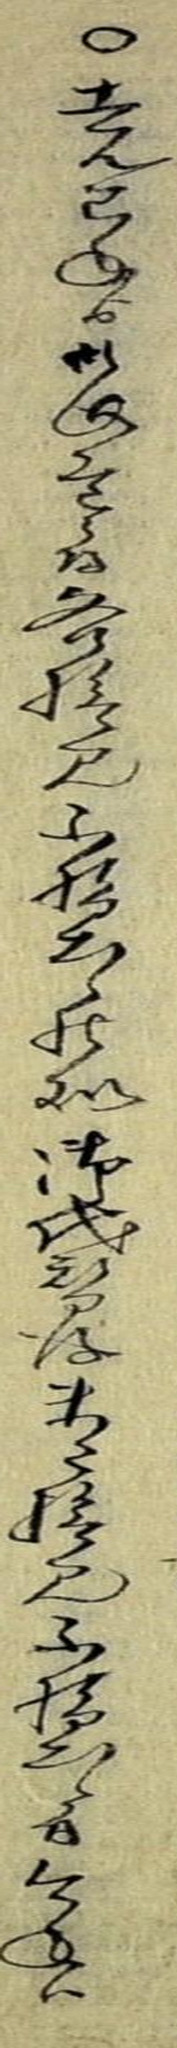○去ル己年ゟ御趣意に付各検見不指出候然処御代替後未た検見不指出候付今年は
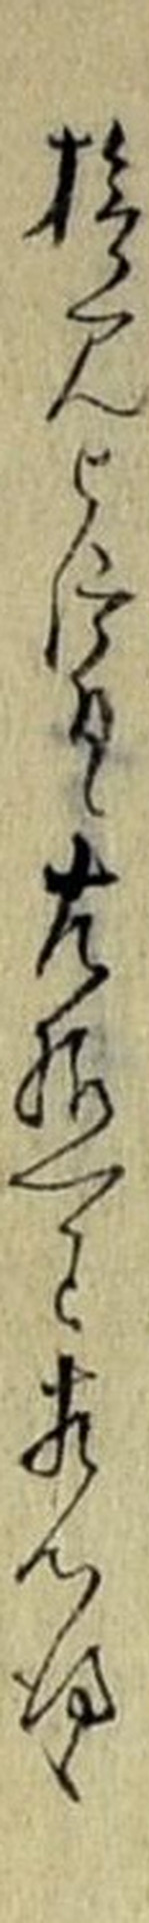検見被仰付候左様可被相心得候
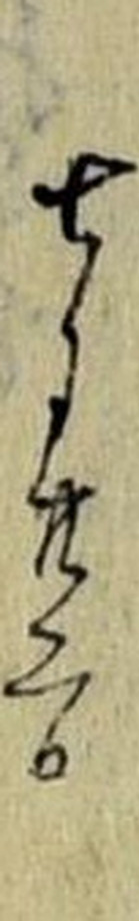七月廿二日
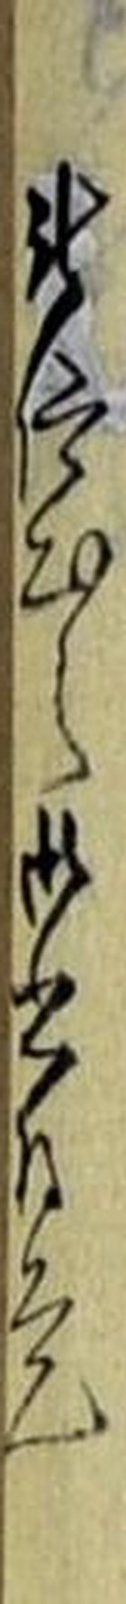被仰出候御書付覚
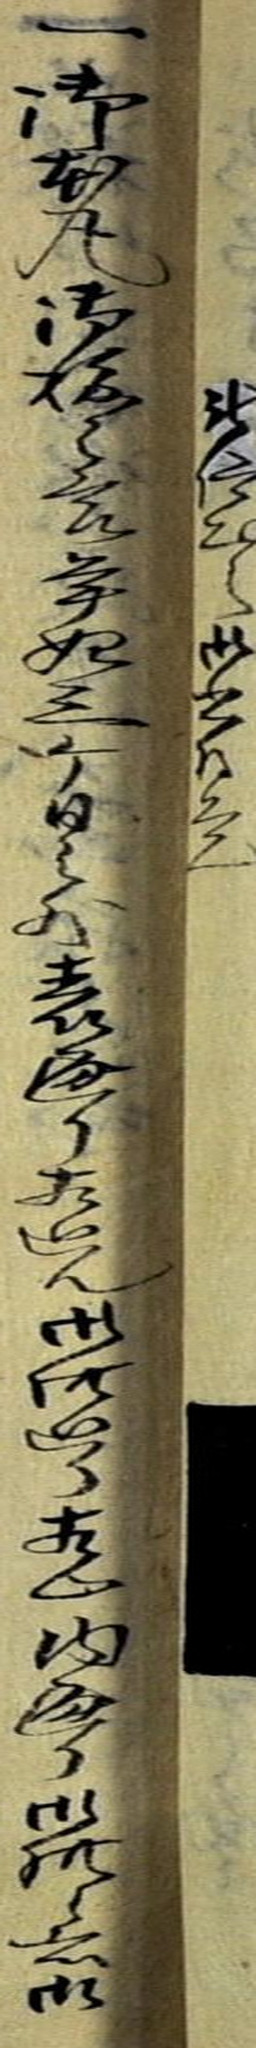一御本丸御移之節年始三ヶ日之外表通り相廻ル御供廻り相止内通り御供之者御
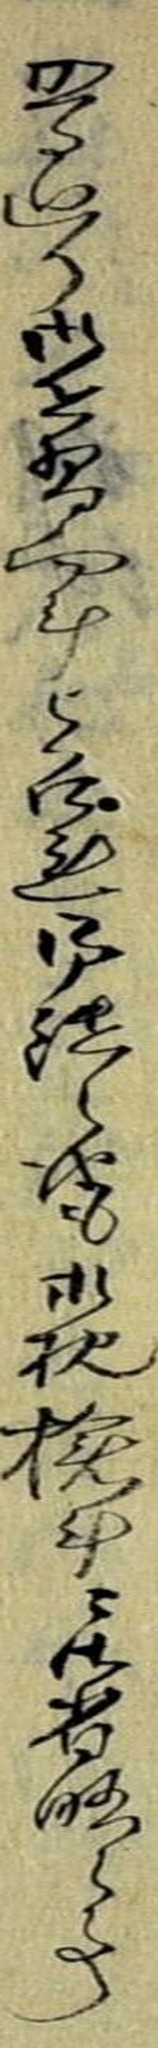駕廻り御近習向斗被召連御継之儀も御枕槍斗に御省略之事
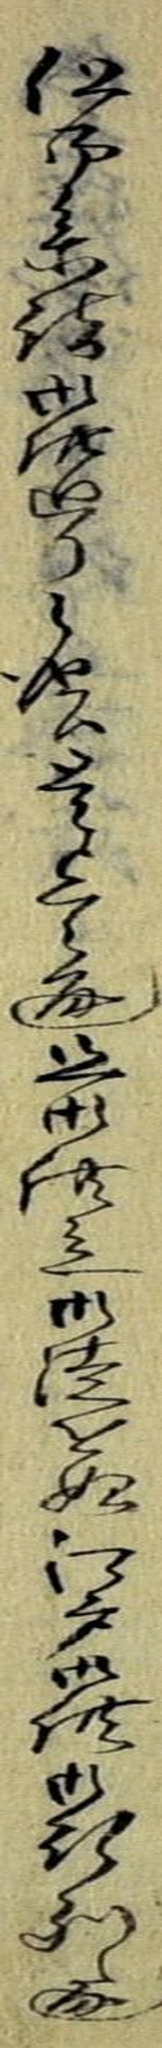但御参詣御供廻り之儀は是迄之通且御供立御徒を始江戸御供御行列之通
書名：命令之部 四
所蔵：福井県文書館 Fukui Prefectural Archives
